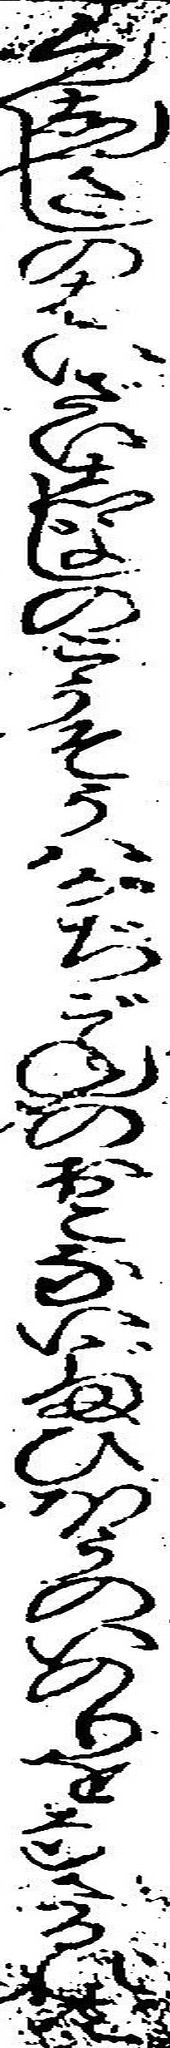くんしんさしのはいざいしよじのこうそうはがぢごねんのおこないごまひほうのいのりをなさるれ共
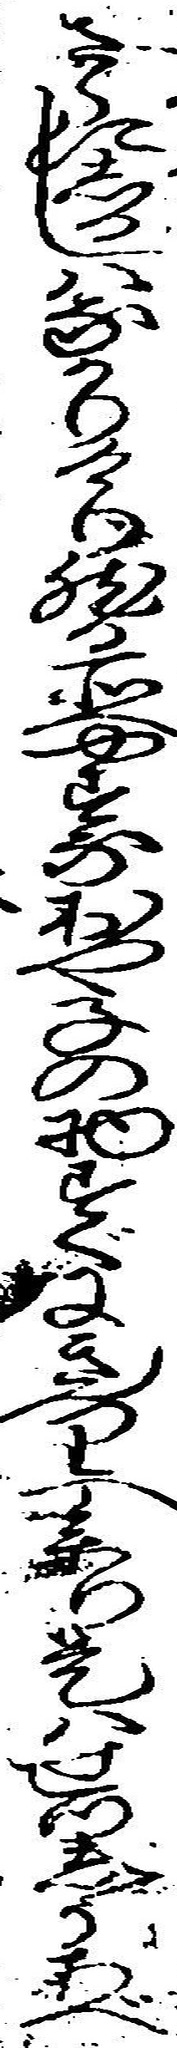さらにしるしはなかりけり然る所へやすなおや子の物すぐにきんりへ参り是はせつしうあべ
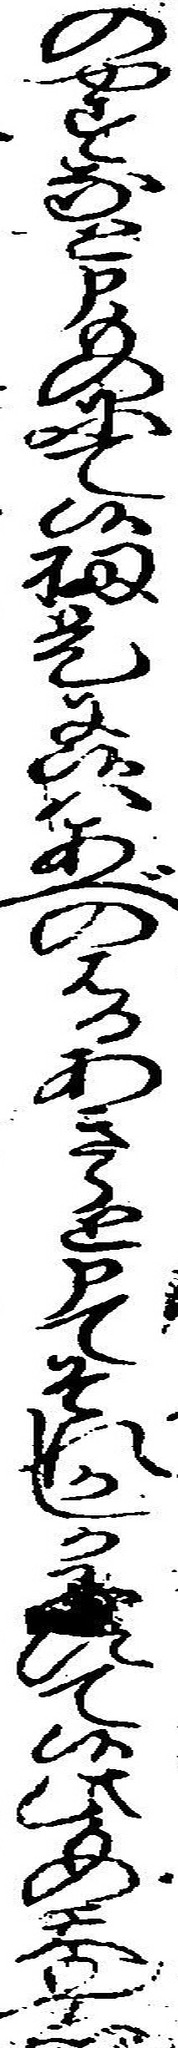のやすなと申ものにて候扨是に候はあべのはるあきらと申てそれかしか子にて候此もの天もんし
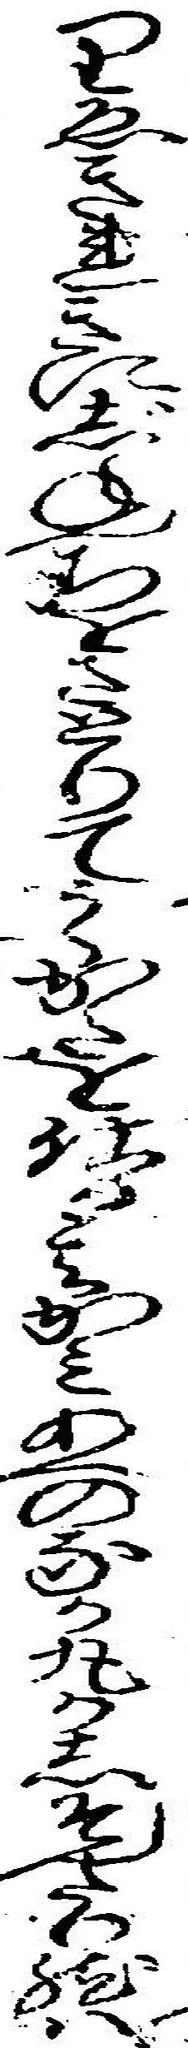りゑきれきにじねんちをさとりてうらかたを仕る其かみあへのなか丸かしそんたり然は
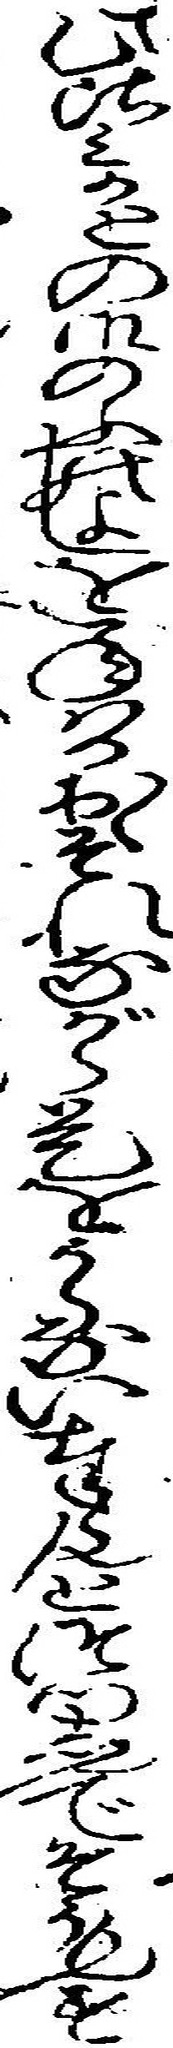此頃みかとの御のふのよしを承はりおゝそれながら是をうらない奉らんとつつしんでそうもんす
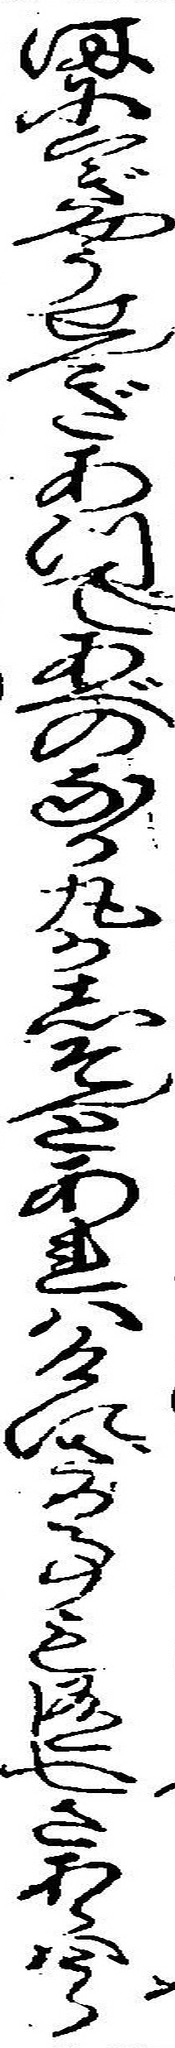時にくぎやうせんぎあつてあべのなか丸かしそんとあれはけにさる事も有へしさあらはうら
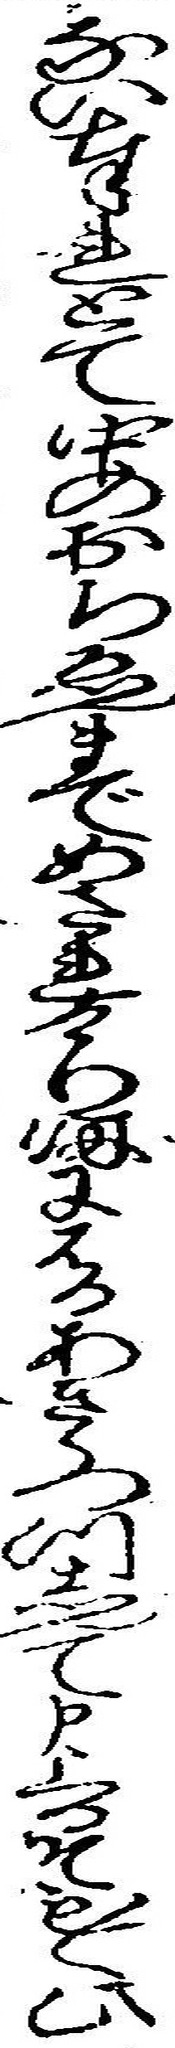ない奉れとて中のおちゑんまでめされけり時にはるあきらつつしんて申上るそも〳〵此
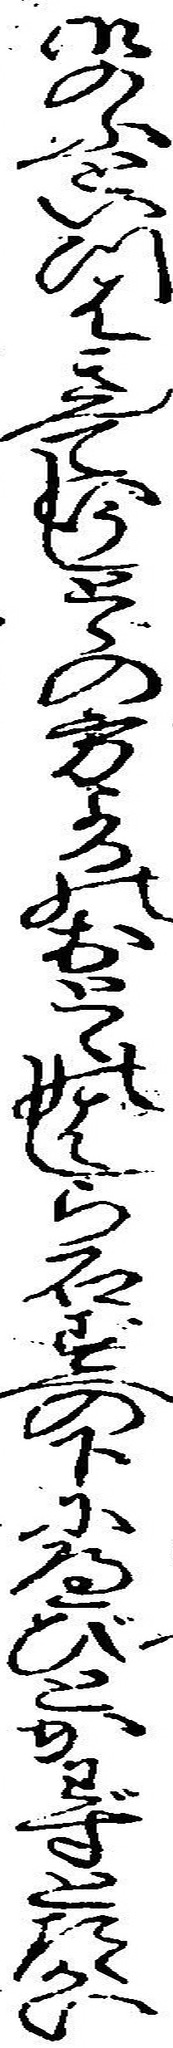御のふといつはきんていうしとらの方よるのおとゝのはしら石ずへの下にへびとかわずとたゝかい
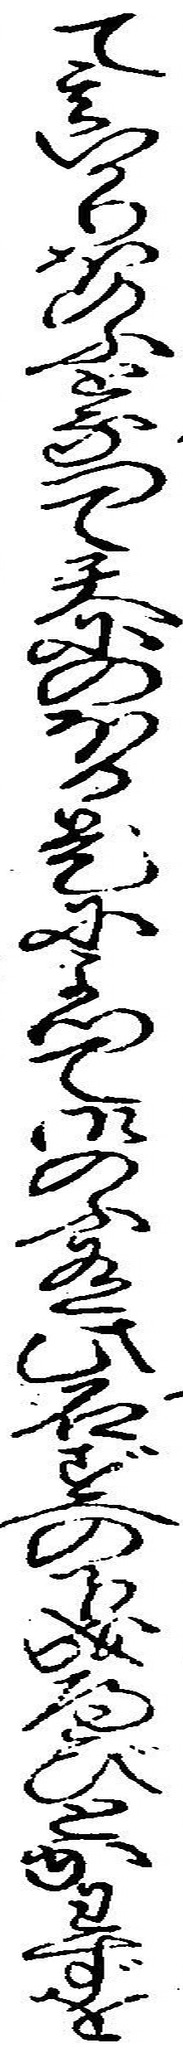て其いかりほのふとなつて天にのぼる是によつて御のふ有此石ずへの下成へびとかわずを
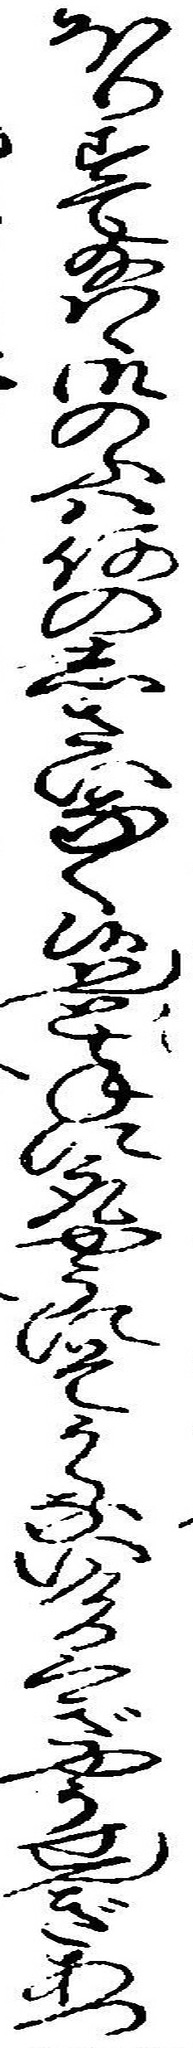ほりすて給はゝ御のふは何のしさいなく候はんと手に取やうにそうらないけるくぎやうせんぎあつ
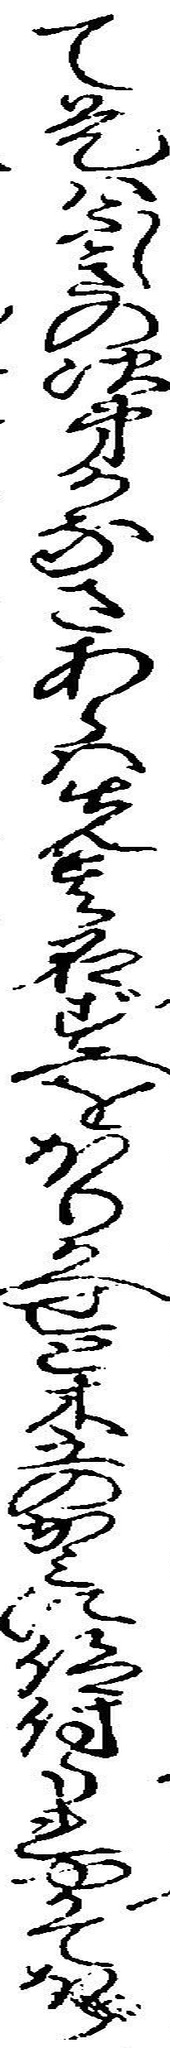て是はふしきの次第かなさあらは先其石ずへをほりかへせと木工のかみに仰付られやかてほら
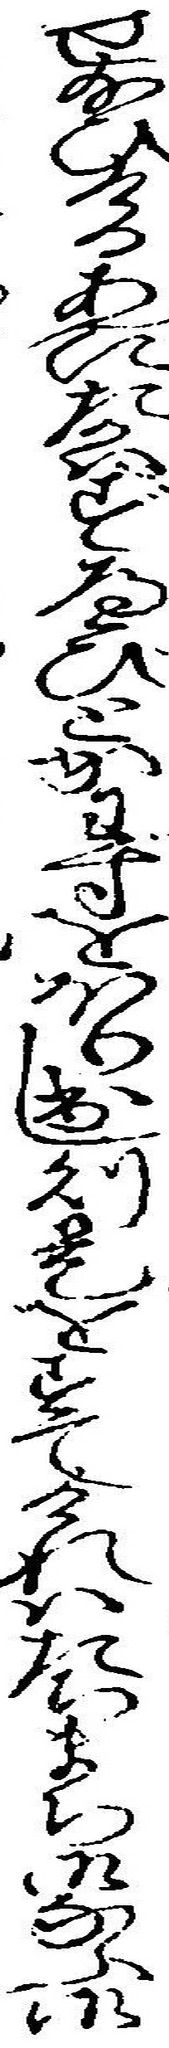せ給ひけるあんにたかはずへひとかわすをほり出し則是をすてけれはたちまち御なふ御
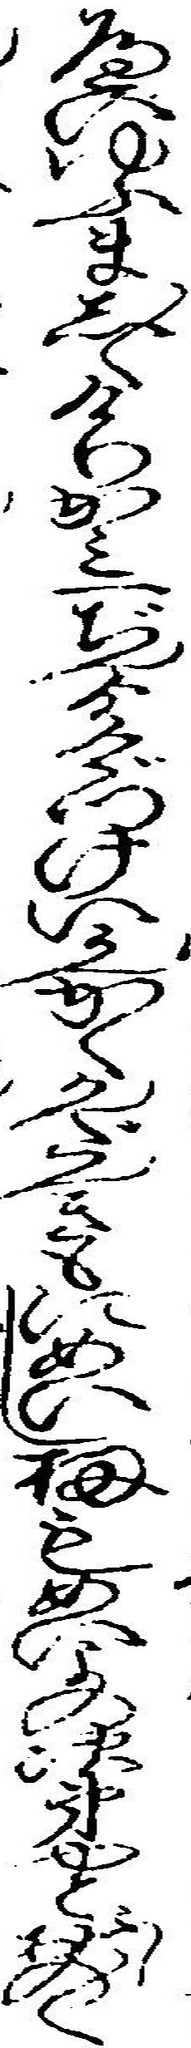へいゆふまし〳〵けりかみ一ぢんゟげつけいうんかくかんだんきもにめいし扨もめいよの次第やとふしおの〳〵
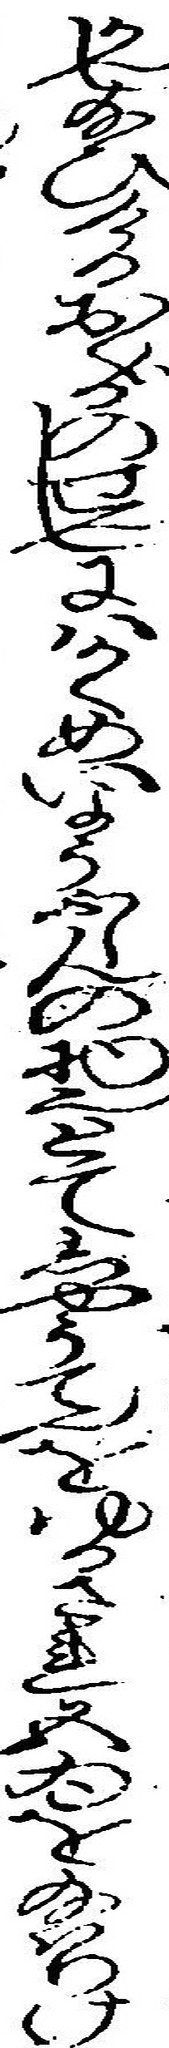かんし給ひけるおくゟのせんしにはかくめいようふしんの物也とてしやうてんをゆるされ五ゐを給はりけ
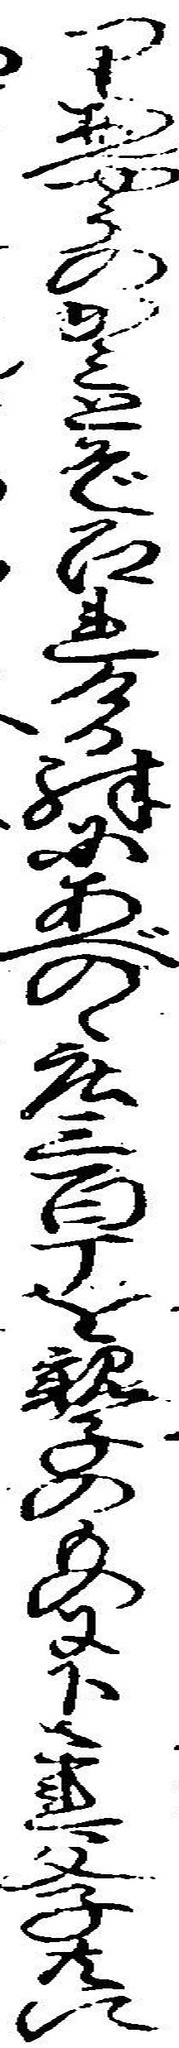りおんやうのかみとぞ召れける殊にあべのゝ庄三百丁を親子のものに下され父子共に
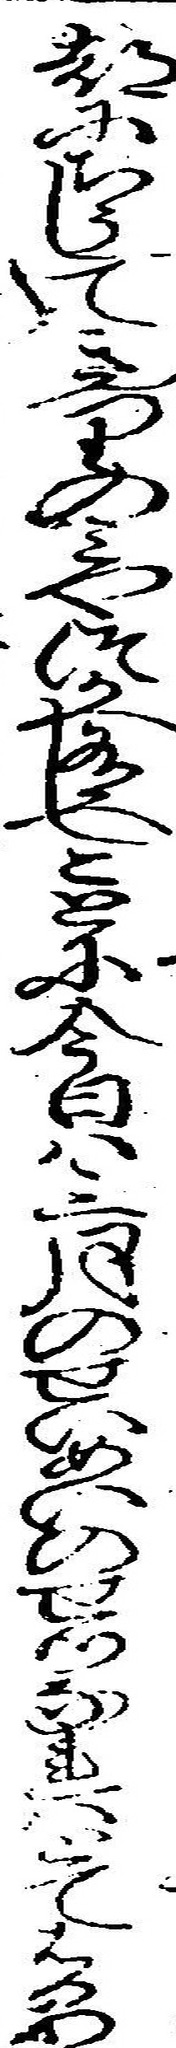都にちうしてきんりのみやつかへ有へしことに今日は三月のせいめいのせつなれはとてはるあ
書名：[しのだづまつりぎつね付あべの清明出生]
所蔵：東京大学総合図書館 General Library in the University of Tokyo, JAPAN
